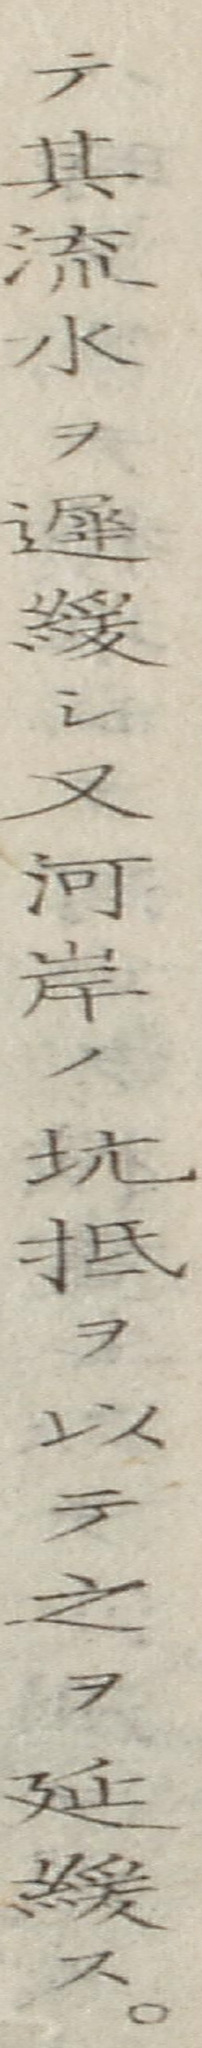テ其流水ヲ遅緩シ又河岸ノ坑抵ヲ以テ之ヲ延緩ス。
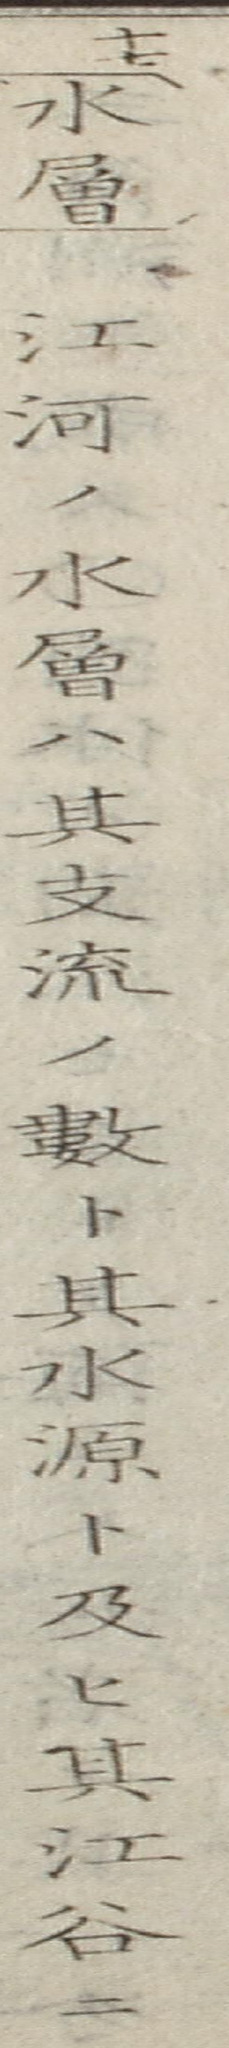十七〔水層〕江河ノ水層ハ其支流ノ数ト及ヒ其江谷ニ
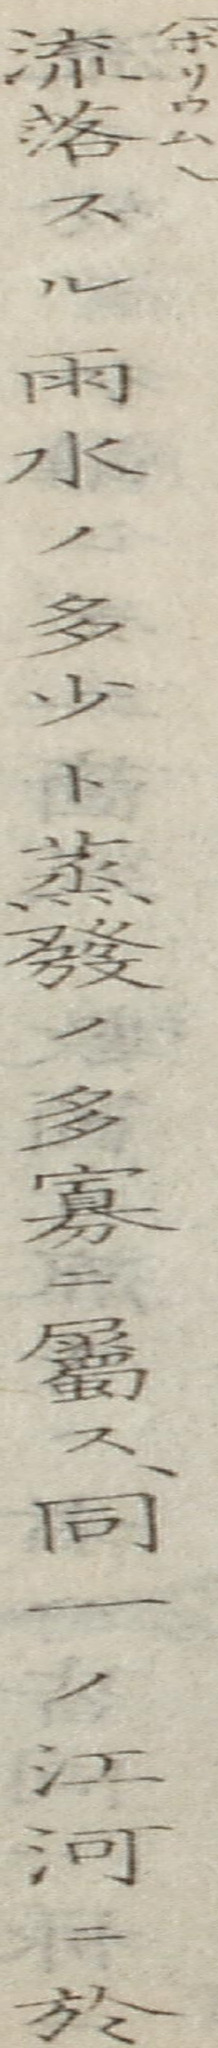流落スル雨水ノ多少ト蒸発ノ多寡ニ属ス、同一ノ江河ニ於
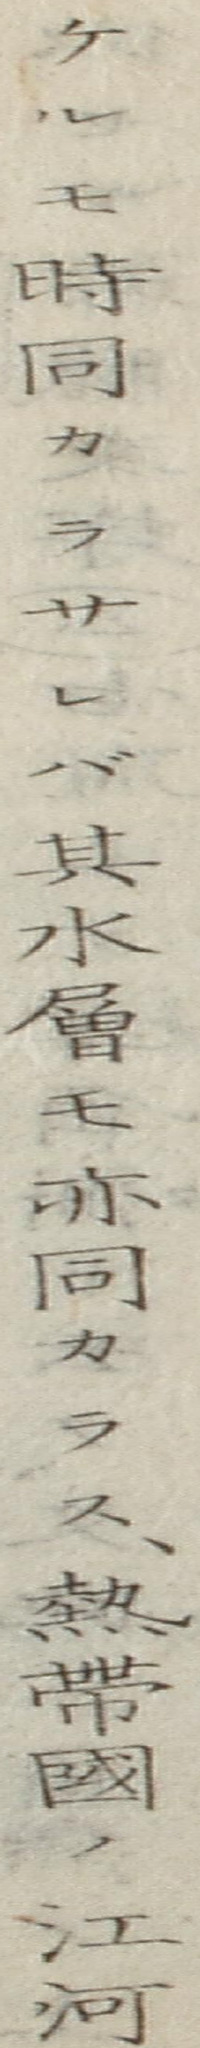ケルモ時同カラサレバ其水層モ亦同カラズ、熱帯国ノ江河
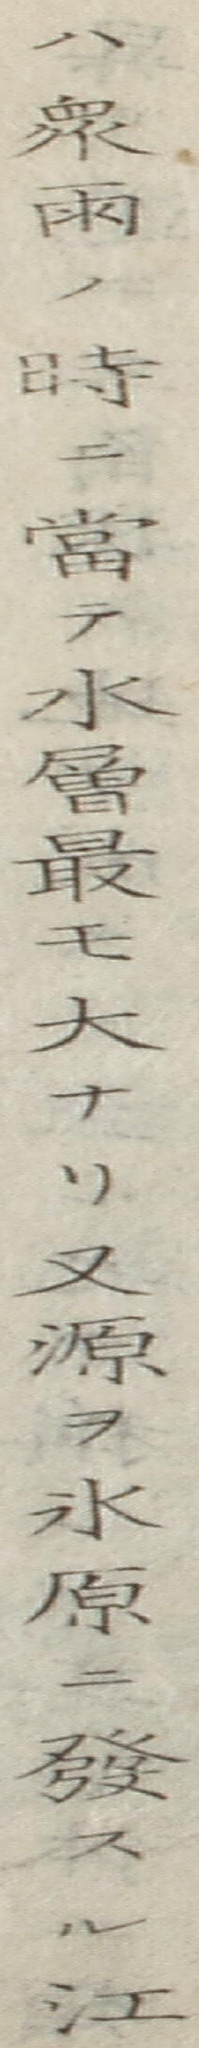ハ衆雨ノ時ニ当テ水層最モ大ナリ又源ヲ氷原ニ発スル江
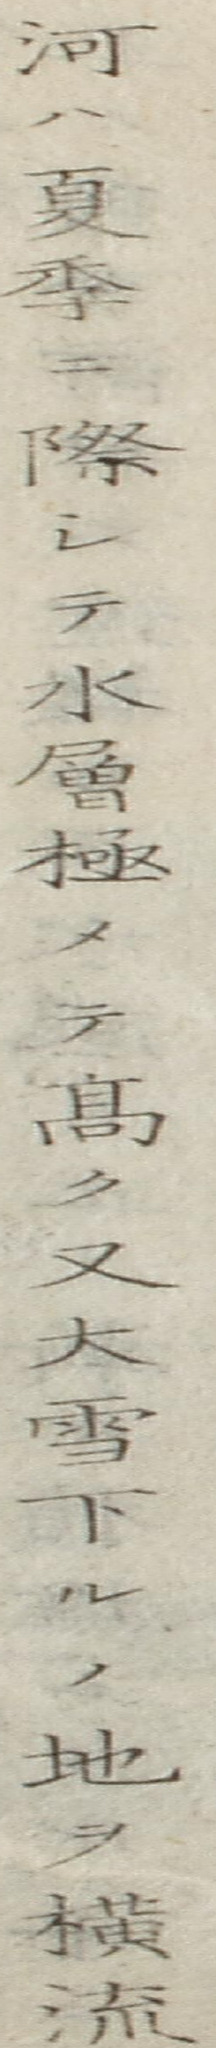河ハ夏季ニ際シテ水層極メテ高ク又大雪下ルヽ地ヲ横流
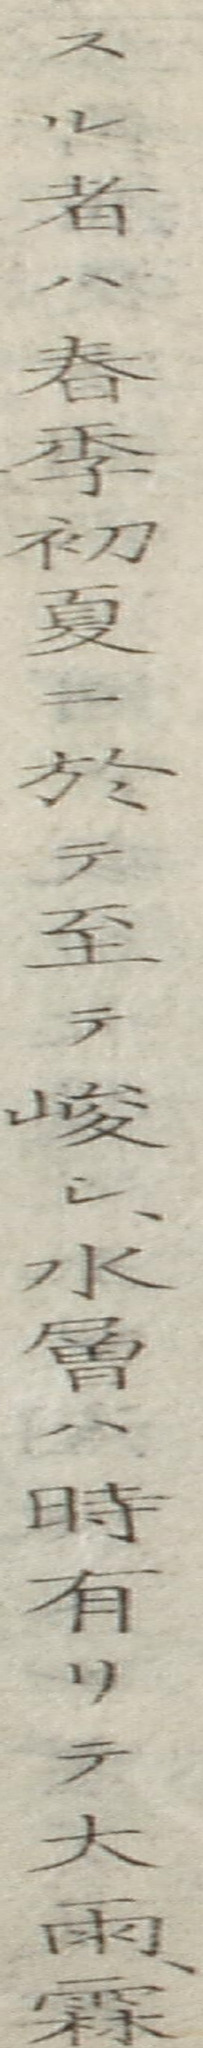スル者ハ春季初夏ニ於テ至テ峻シ、水層ハ時有リテ大雨霖
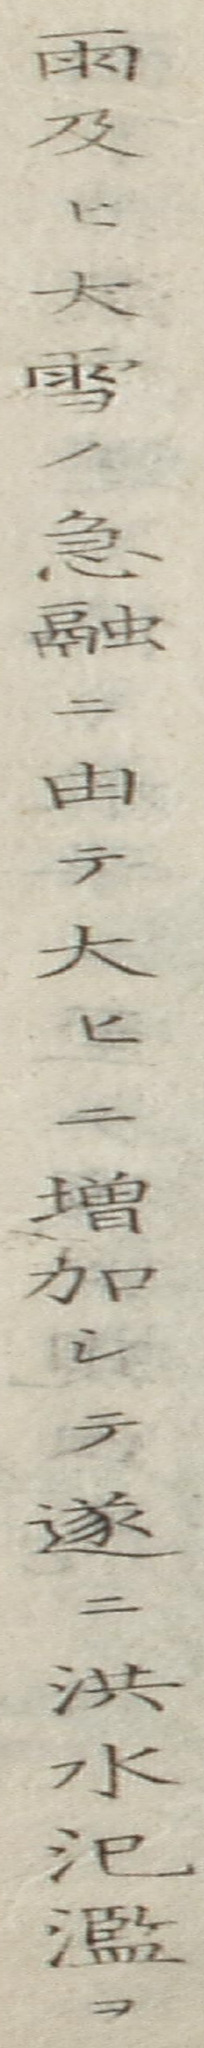雨及ヒ大雪ノ急融ニ由テ大ヒニ増加シテ遂ニ洪水氾濫ヲ
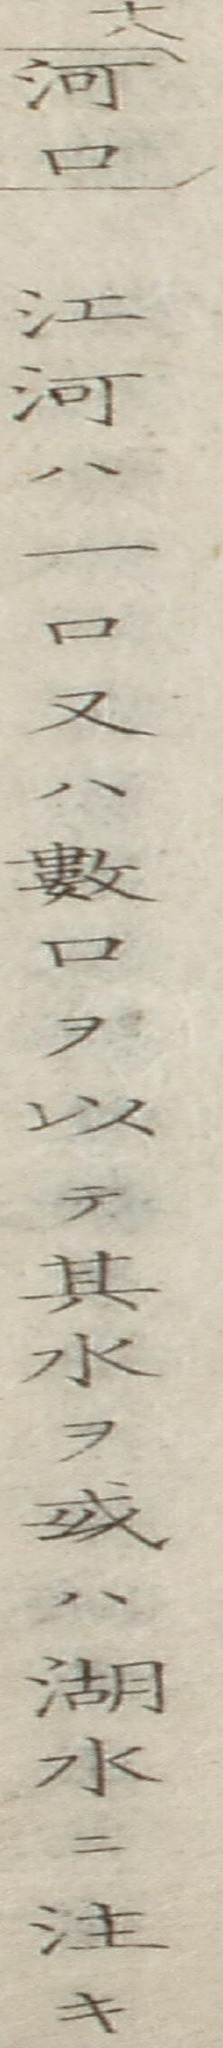十八〔河口〕江河ハ一口又ハ数口ヲ以テ其水ヲ或ハ湖水ニ注キ
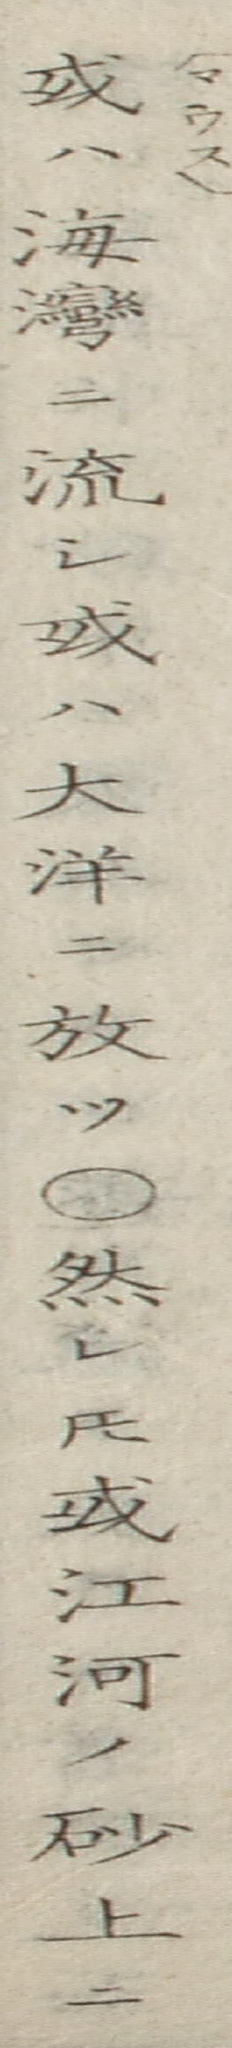或ハ海湾ニ流シ或ハ大洋ニ放ツ〇然テトモ江河ノ砂上ニ

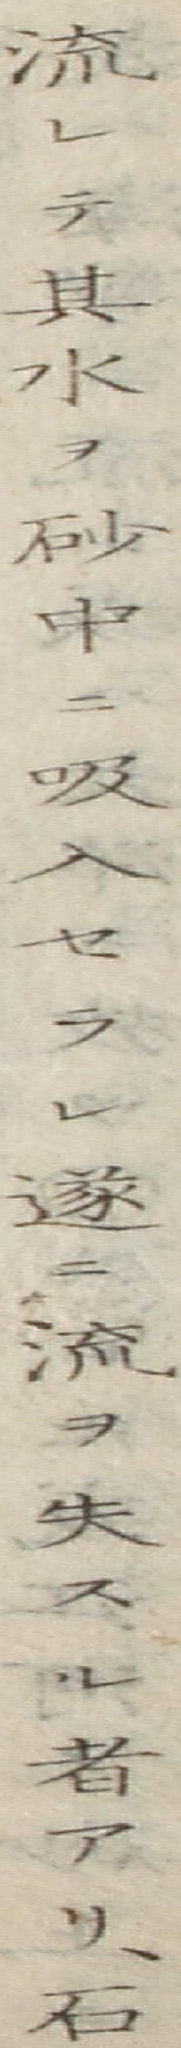流レテ其水ヲ砂中ニ吸入セラレ遂ニ流ヲ失スル者アリ、石
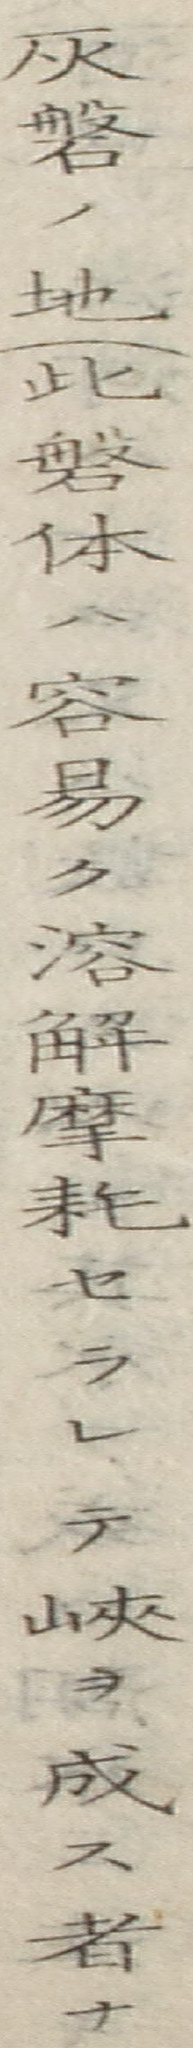灰盤ノ地（此盤体ハ容易ク溶解摩耗セラレテ峡ヲ成ス者ナ
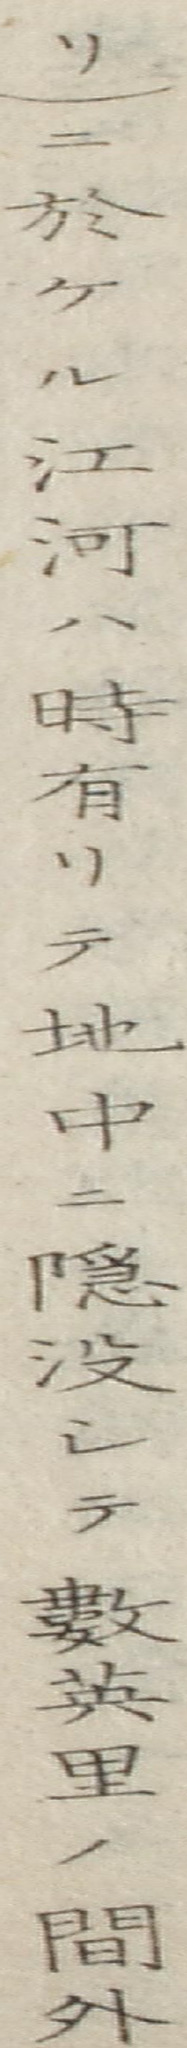リ）ニ於ケル江河ハ時有リテ地中ニ隠没シテ数英里ノ間外
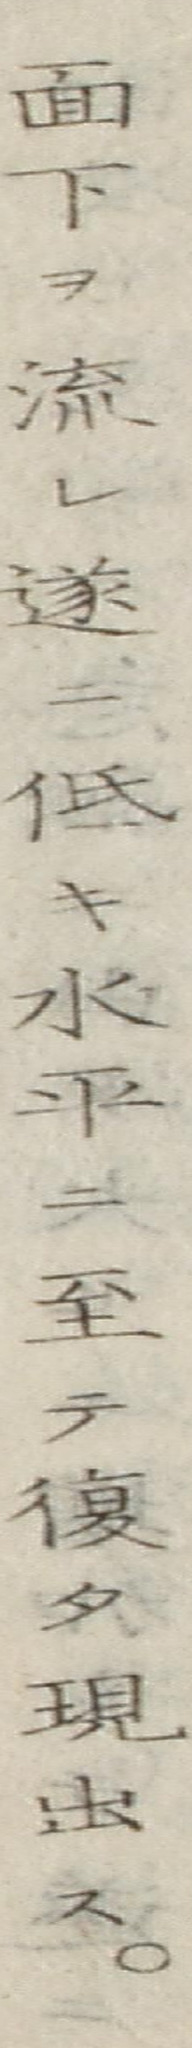面下ヲ流レ遂ニ低キ水平ニ至テ復タ現出ス。
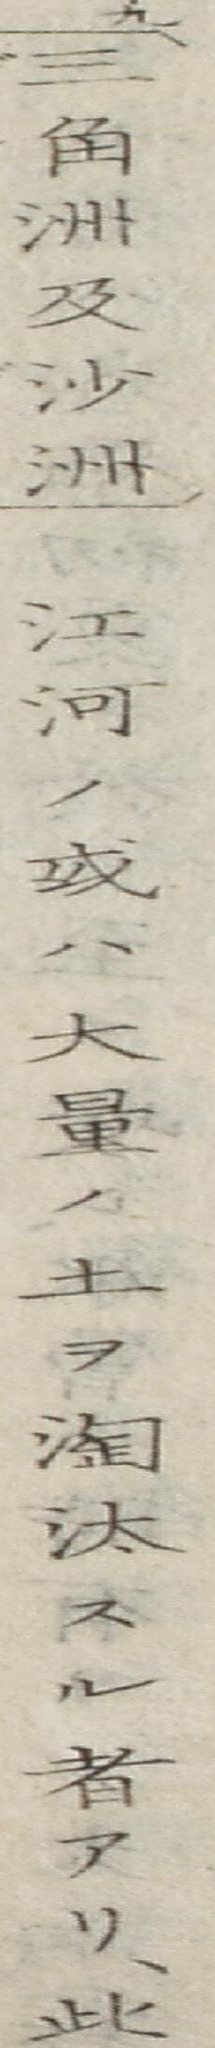十九〔三角州及沙洲〕江河ノ或ハ大量ノ土ヲ淘汰スル者アリ、此
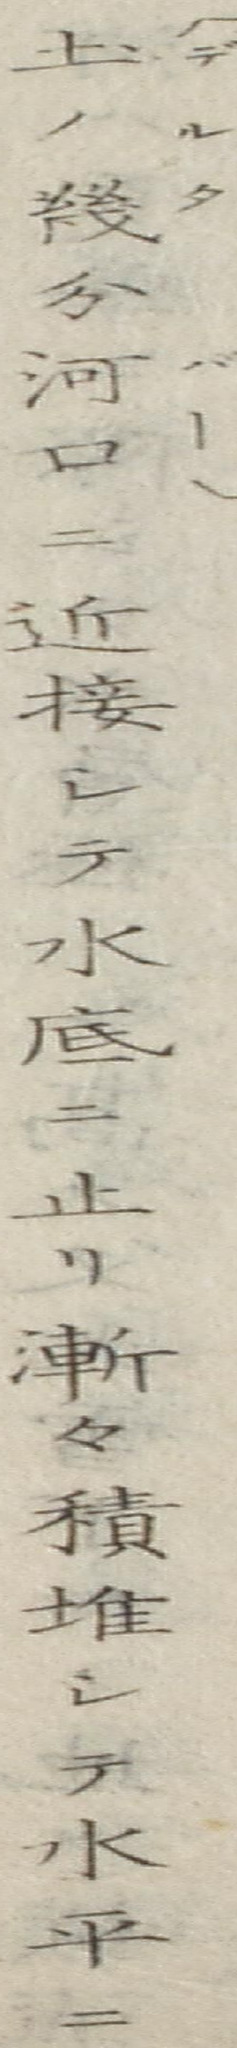土ノ幾分河口ニ近接シテ水底ニ止リ漸々積堆シテ水平ニ
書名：地形論　巻二
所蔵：東京大学地震研究所図書室 Earthquake Research Institute Library, The University of Tokyo, JAPAN
